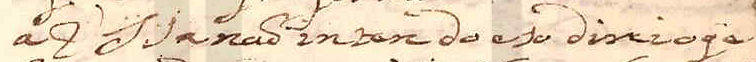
a V J.S a naõ intendo e so direi o q̄ e
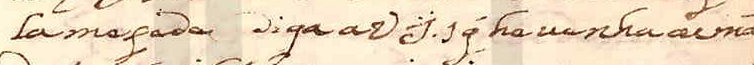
la me pede diga a V J.S q̄ ha uenha ou mā
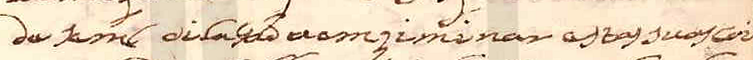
de sem dilasaõ a emziminar estas suas coi
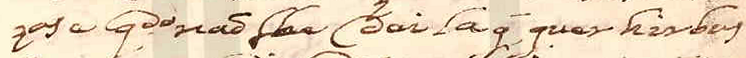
zas e qdo naõ lhe dai la q̄ quer hir bus
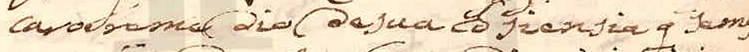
car o remedio de sua cōsiensia q̄ se mos
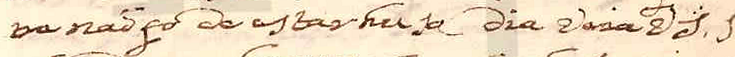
tra naõ pode estar hu so dia veia V J.S
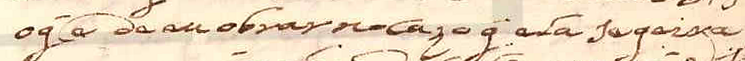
o q̄ e de eu obrar no cazo q̄ ela se qeira
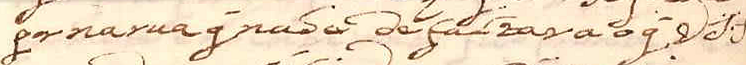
por na rua q̄ naõ a de faltar o q̄ V J.S
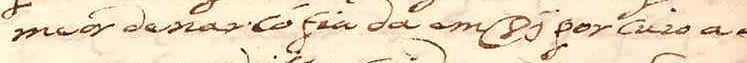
me ordenar cōfiada em Ds̄ por cuio a
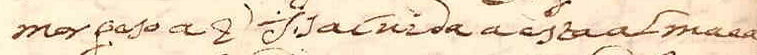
mor peso a V J.S acuida a esta alma e a
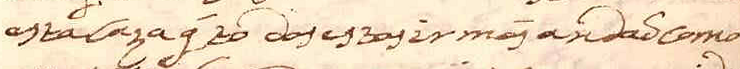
esta Caza q̄ todas estas irmās andaõ como
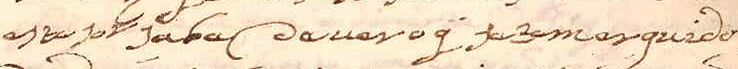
este sor sabe de uer o q̄ se tem erguido
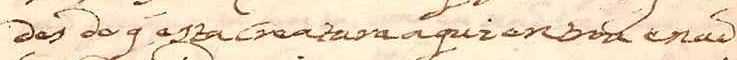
desde q̄ esta creatura aqui entrou e naõ
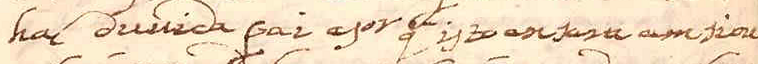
ha duuida pai e sor q̄ isto ensera em si ou
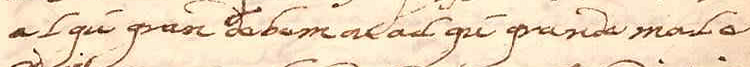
algū grande bem ou algū grande mal e
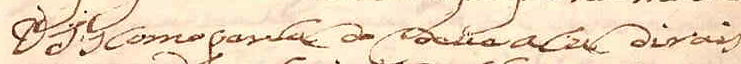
V J.S como perlado deue acudir a is
